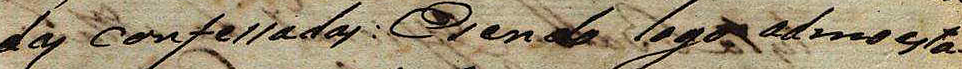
das confessadas: E sendo logo admoesta
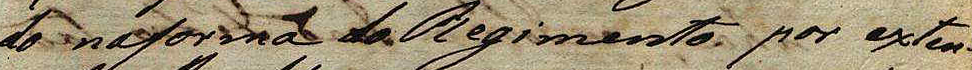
do na forma do Regimento por exten
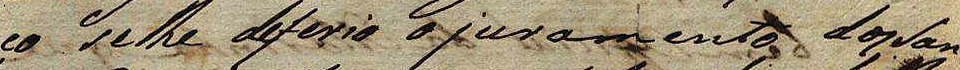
ço se lhe deferio o juramento dos san
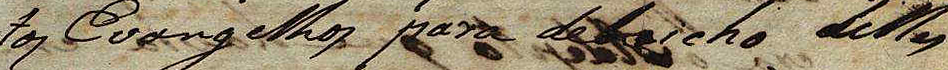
tos Evangelhos para debaicho dellas
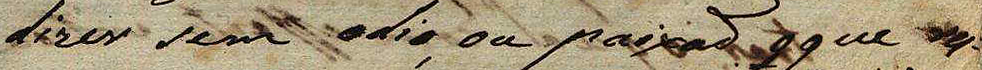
dizer sem odio, ou paixaõ o que res
